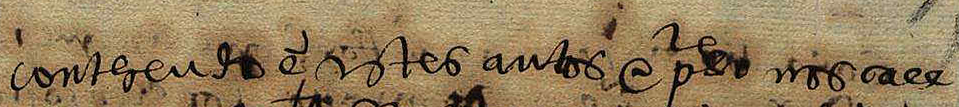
contheudo ē estes autos e preso nos cace
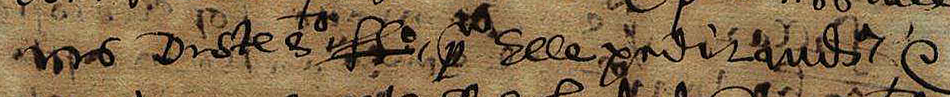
res Deste sto offo, por Elle pedir audja / e
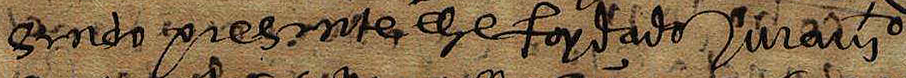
sendo presente lhe foy dado Juramto
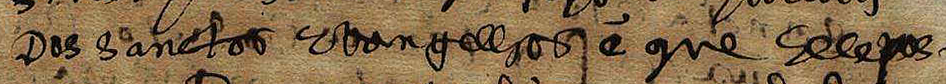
Dos Sanctos Evangelhos ē que Elle pos
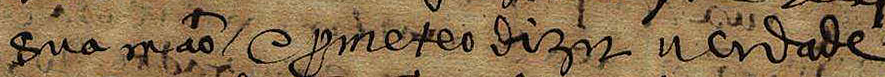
sua mão / e ꝓmeteo dizer uerdade
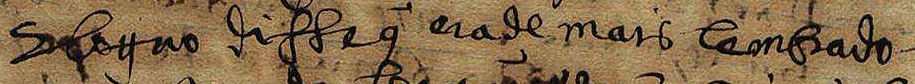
E loguo disse q̄ era de mais lembrado
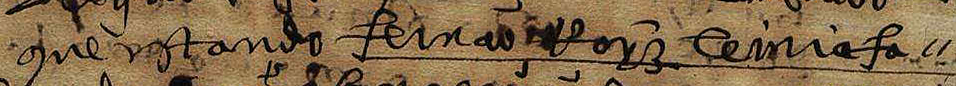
que estando fernaõ Royz̄ leiria fa
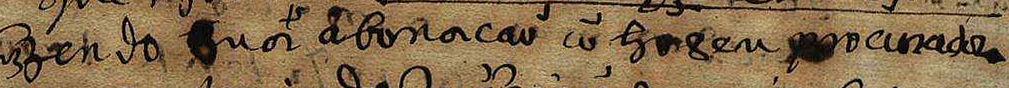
zendo sua + abonação cō ho seu procurador
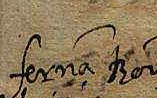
fernā Roīz
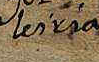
leiria
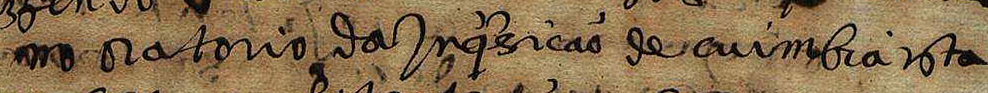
no oratorio da Jnq̄isição de cuimbra esta
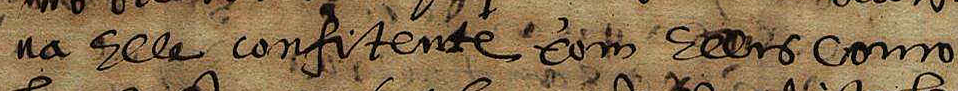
ua Elle confitente com Elles como
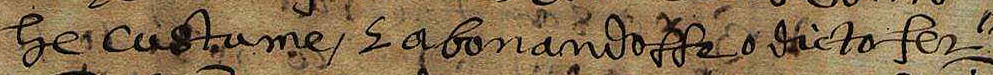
he custume / E abonandosse o dicto fer
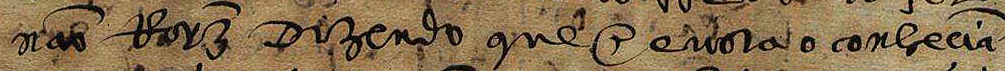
não Royz̄ Dizendo que ē euora o conheciā
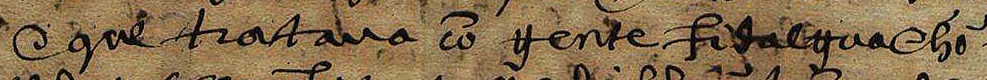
e que trataua c̄o gente fidalgua e hō
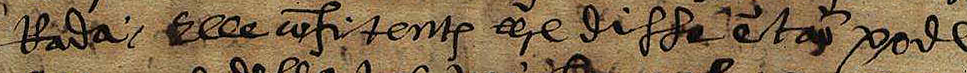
Rada / Elle cōfitente lhe disse ētão pode
